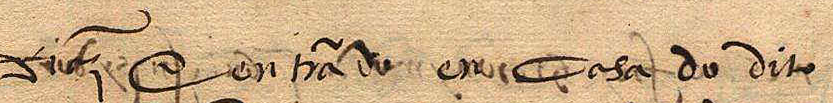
diaz e entrādo em Casa do dito
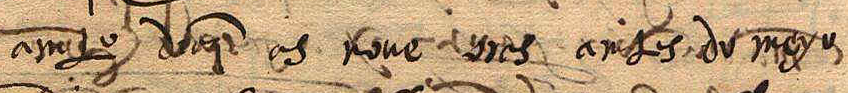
amto diaz as noue oras amtes do meyo
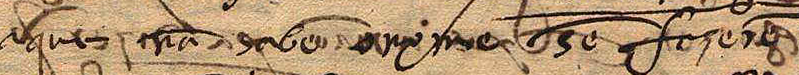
a que nā sabe o nome sē fazerē
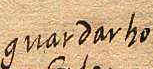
guardar ho
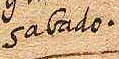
sabado.
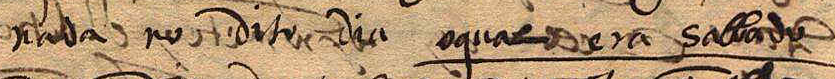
nada no dito dia o qual era sabbado
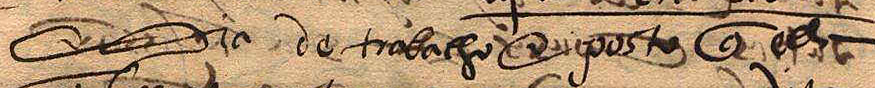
e dia de trabalho e posto q̅ elle
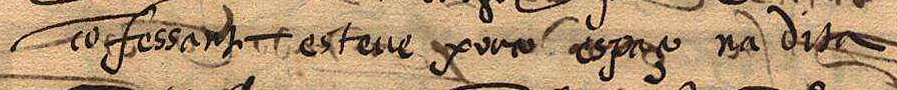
cōfessante esteue pouco espaço na dita
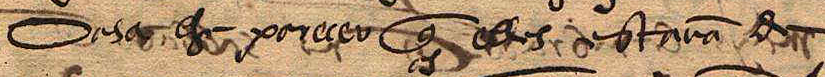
Casa lhe pareceo q̄ elles estauā de
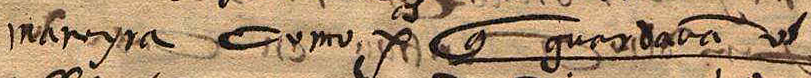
maneyra Como yos q̄ guardavā o
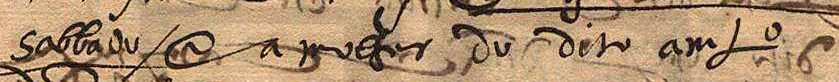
sabbado / e a molher do dito amto
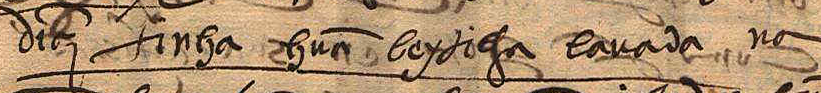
diaz tinha huā beytilha lauada na
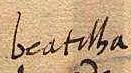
beatilha
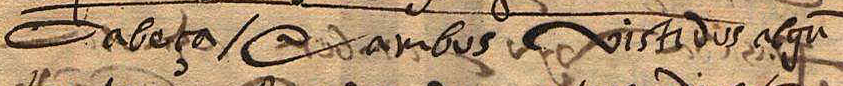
Cabeça / e ambos vistidos algū
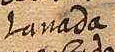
Lauada
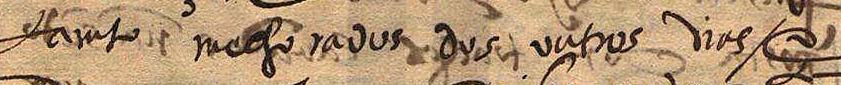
tamto melhorados dos outros dias / e
